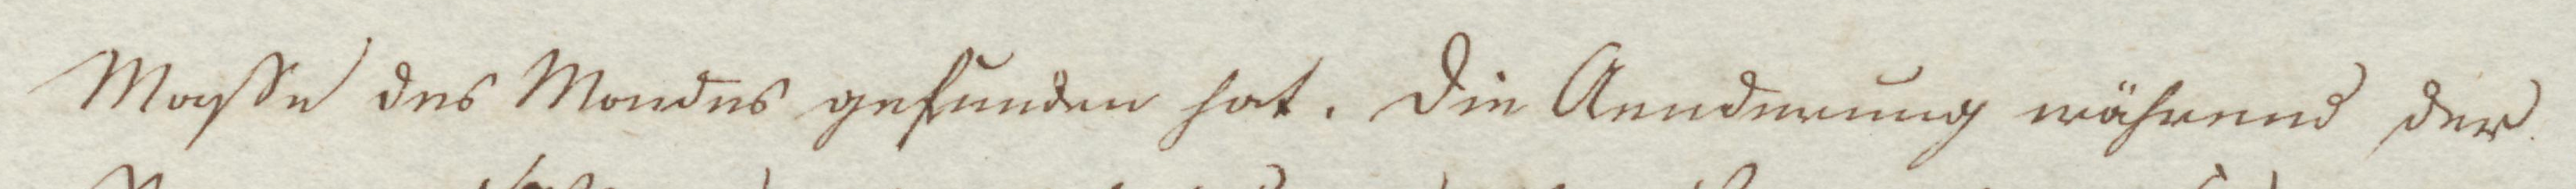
Masse des Mondes gefunden hat. Die Aenderung während der
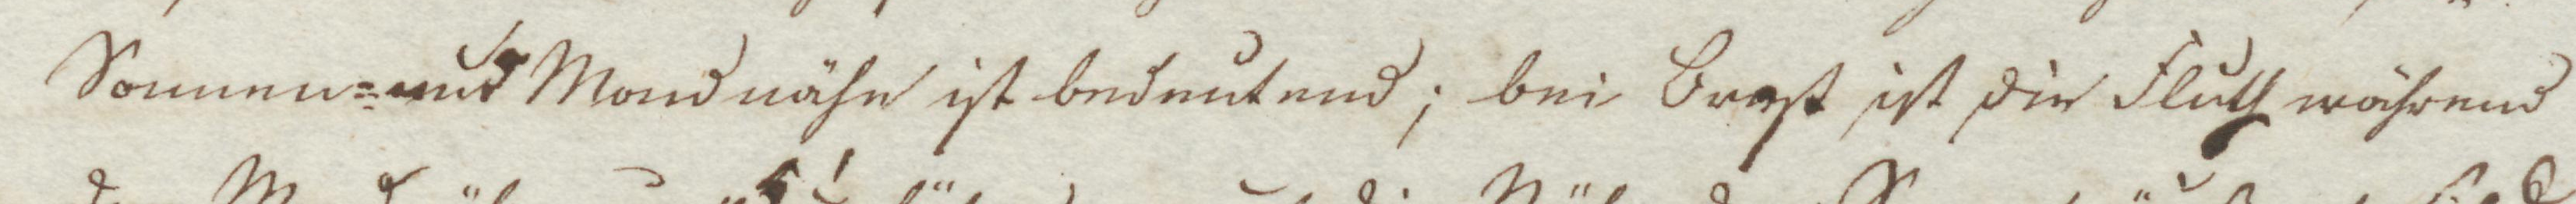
Sonnen- u.und Mondnähe ist bedeutend; bei Brest ist die Fluth während
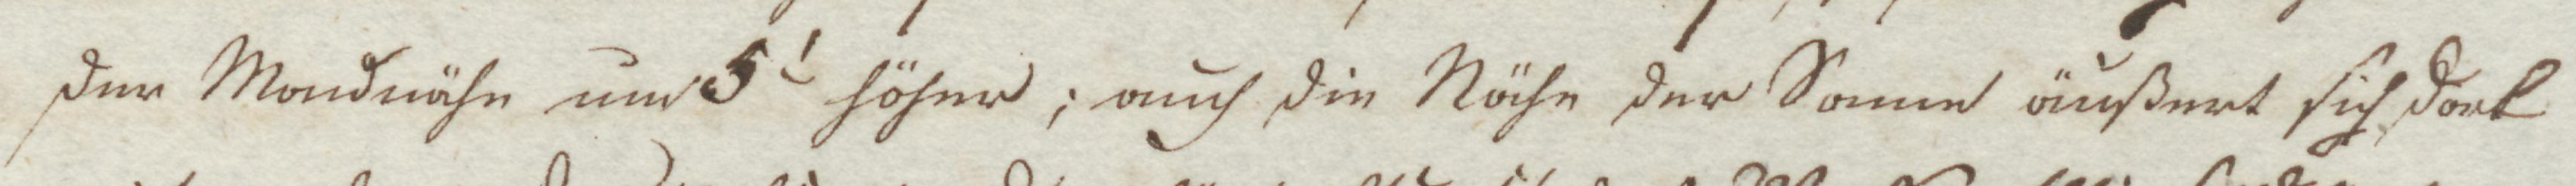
der Mondnähe um 5′ höher; auch die Nähe der Sonne äußert sich dort
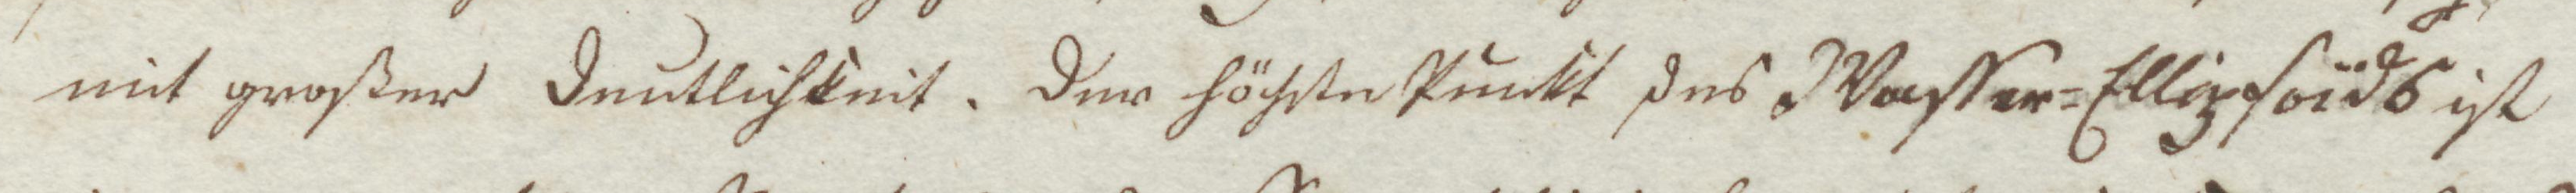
mit großer Deutlichkeit. Der höchste Punkt des Wasser-Ellipsoïds ist
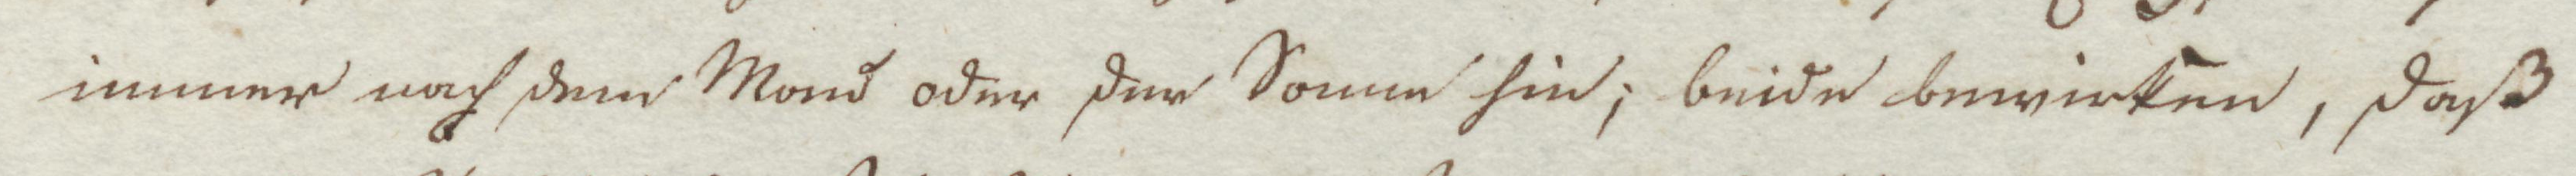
immer nach dem Mond oder der Sonne hin; beide bewirken, daß
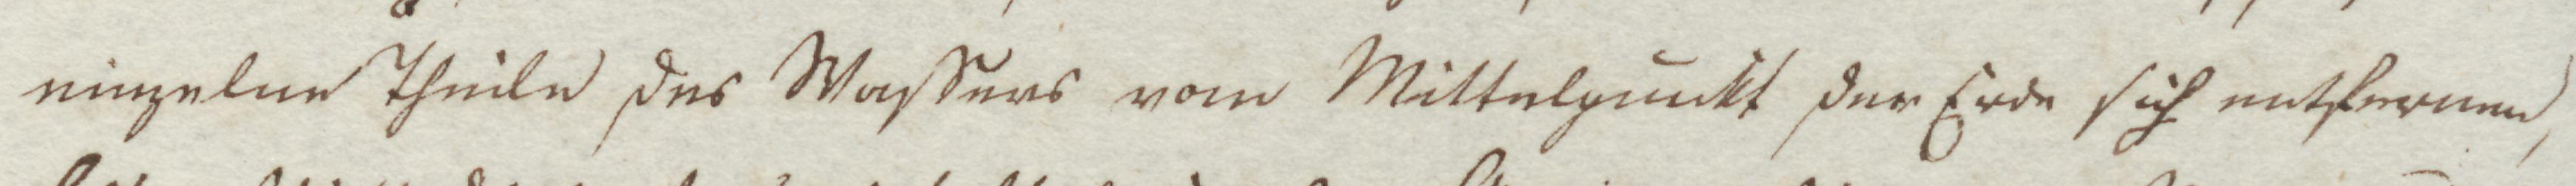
einzelne Theile des Wassers vom Mittelpunkt der Erde sich entfernen
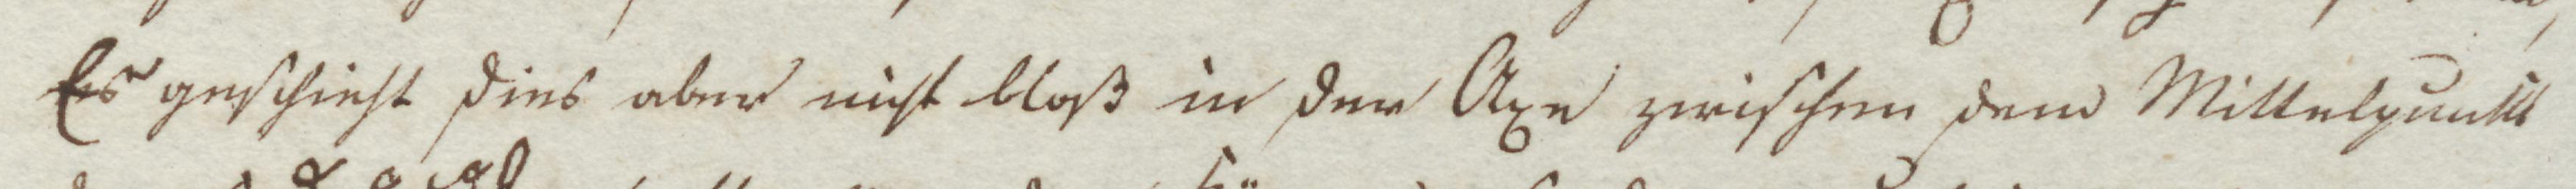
eEs geschieht dies aber nicht bloß in der Axe zwischen dem Mittelpunkt
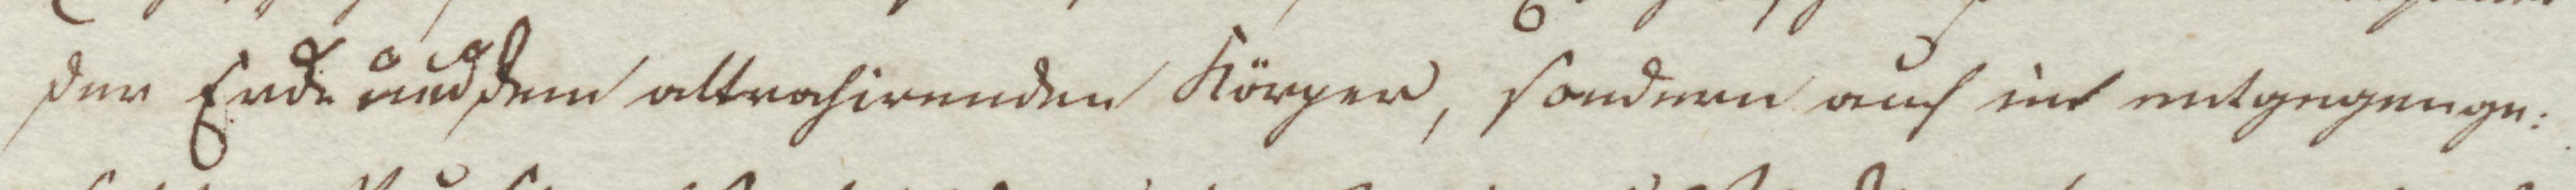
der Erde u.und dem altrahierenden Körper, sondern auch im entgegenge-
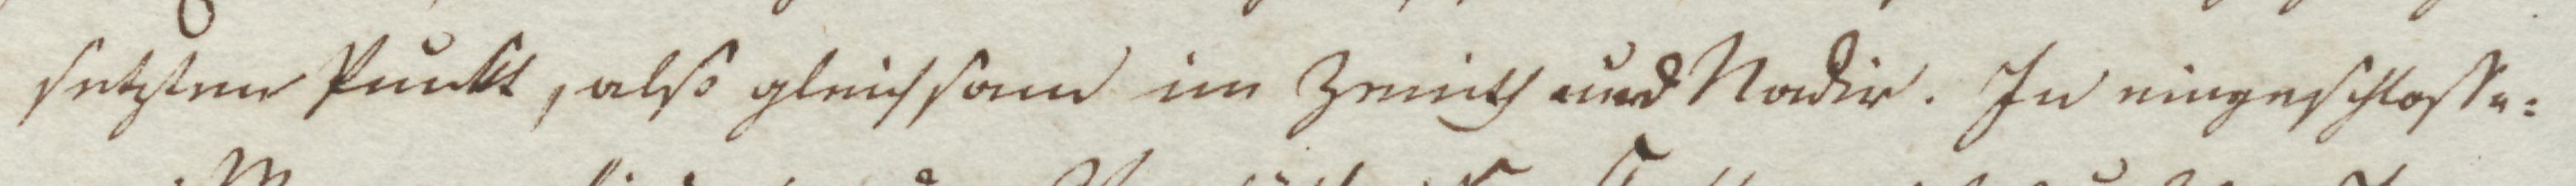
setzten Punkt, also gleichsam im Zenith u.und Nadir. In eingeschlosse-
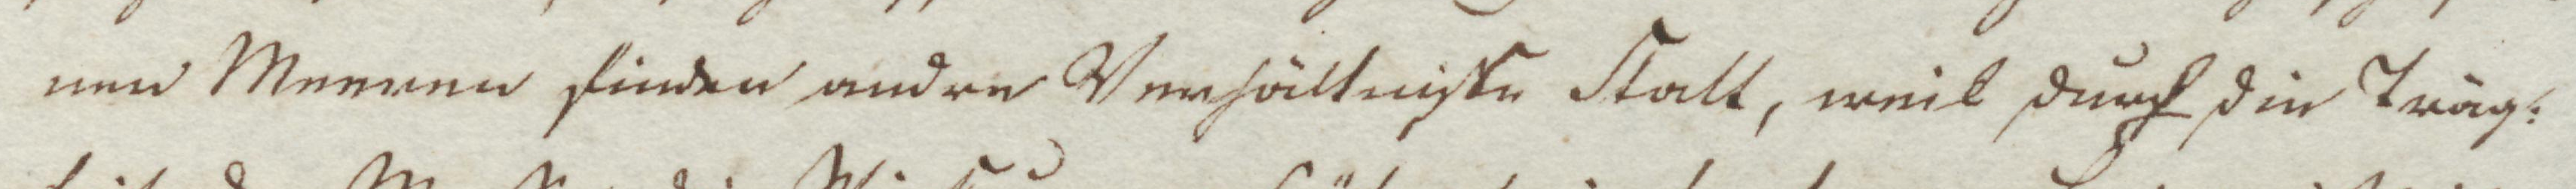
nen Meeren finden andre Verhältnißsse Statt, weil durch die Träg-
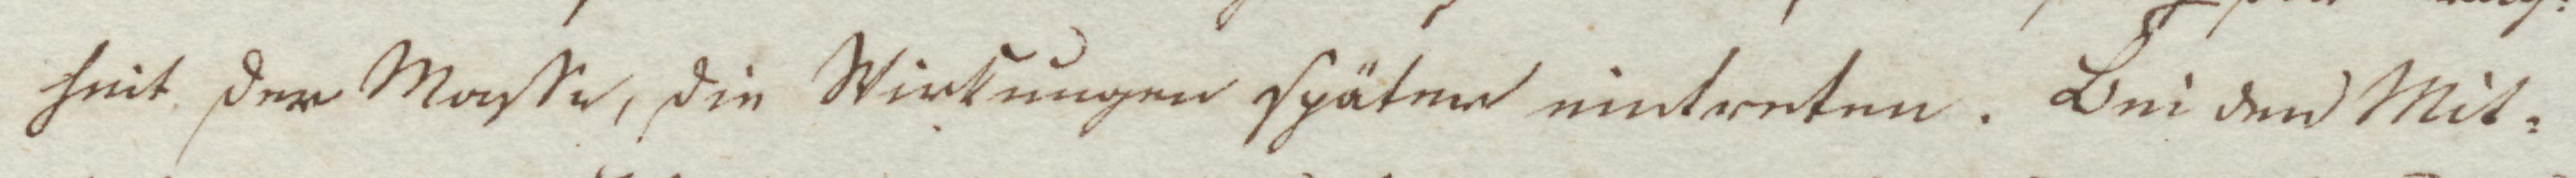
heit der Masse, die Wirkungen später eintreten. Bei den Mit-
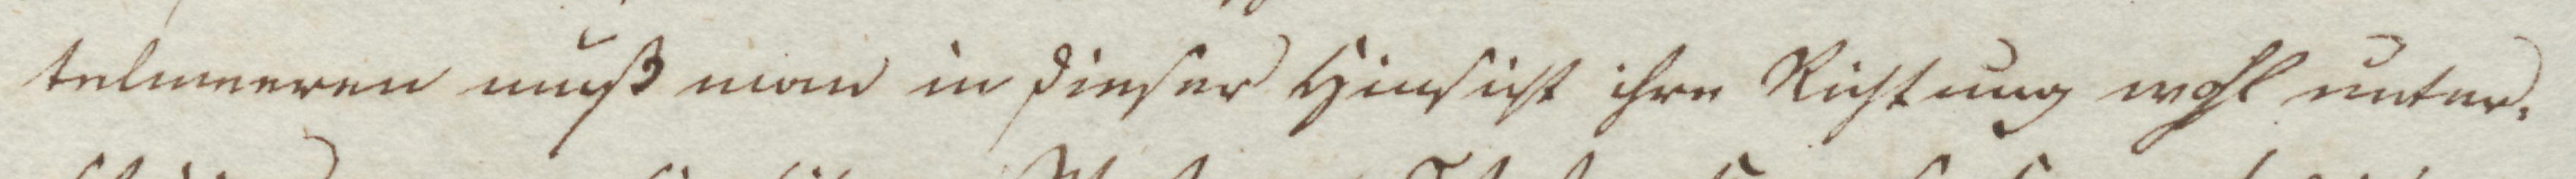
telmeeren muß man in dieser Hinsicht ihre Richtung wohl unter-
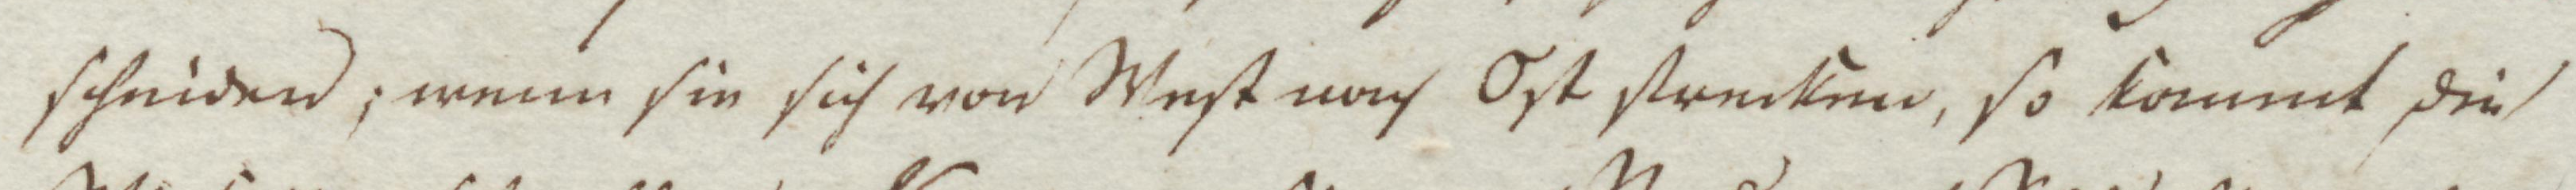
scheiden; wenn sie sich von West nach Ost strecken, so kommt die
